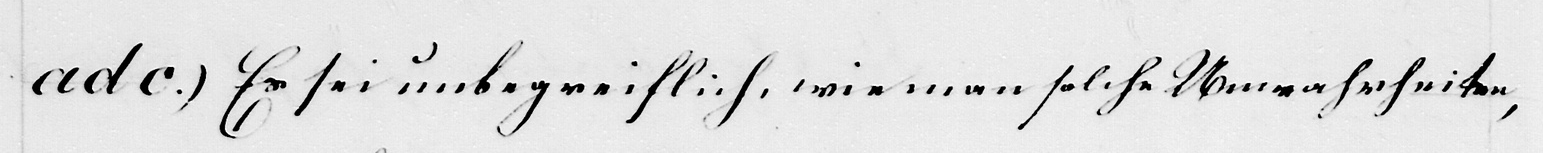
ad c.) Es sei unbegreiflich, wie man solche Unwahrheiten,
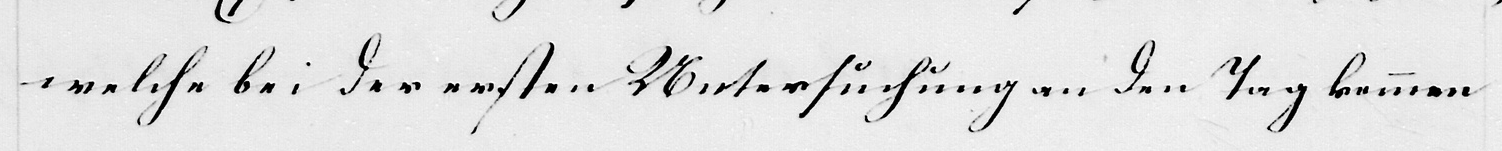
welche bei der ersten Untersuchung an den Tag kommen
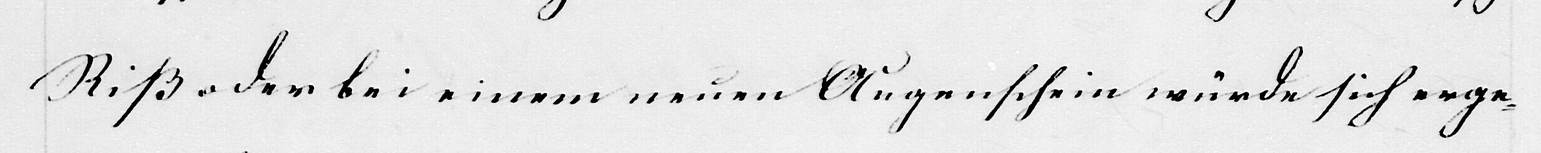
Riß oder bei einem neuen Augenschein würde sich erge¬
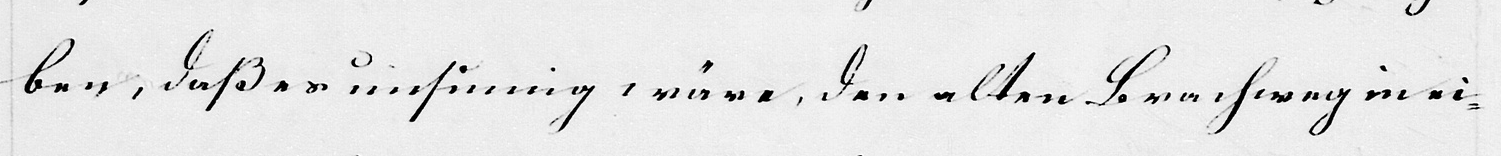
ben, daß es unsinnig wäre, den alten Brachweg in ei¬
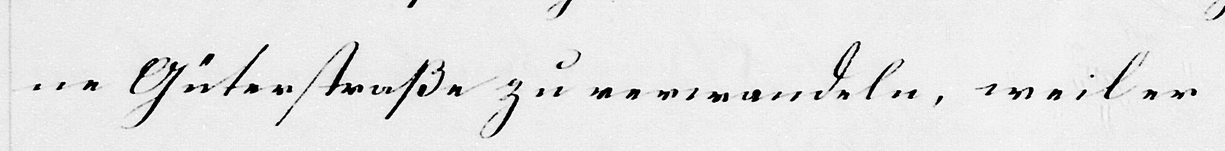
ne Güterstraße zu verwandeln, weil er
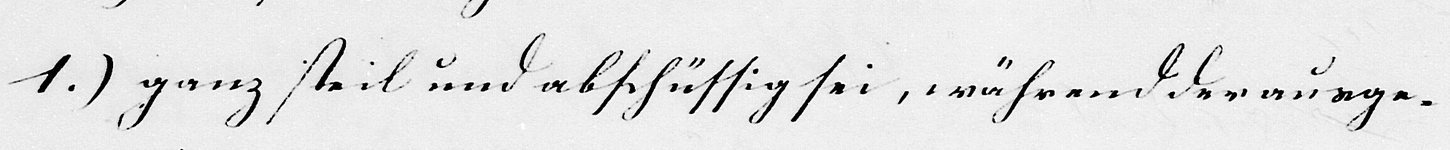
1.) ganz steil und abschüssig sei, während der ausge¬
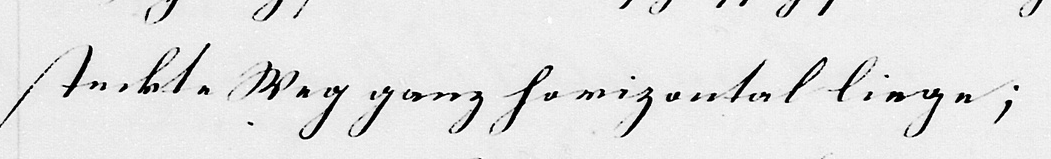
steckte Weg ganz horizontal liege;
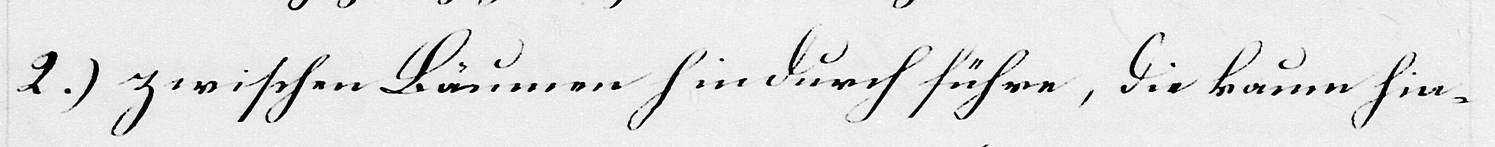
2.) zwischen Bäumen hindurch führe, die kaum hin¬
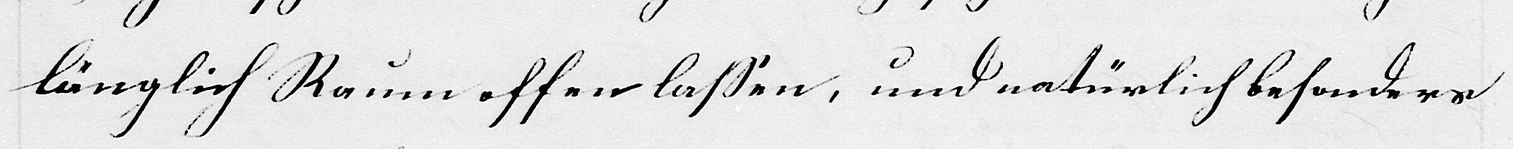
länglich Raum offen laßen, und natürlich besonders
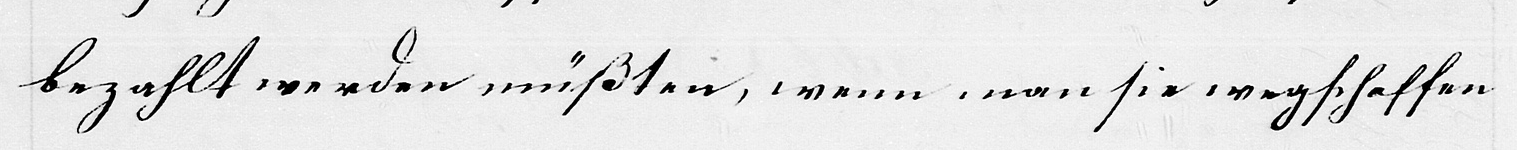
bezahlt werden müßten, wenn man sie wegschaffen
